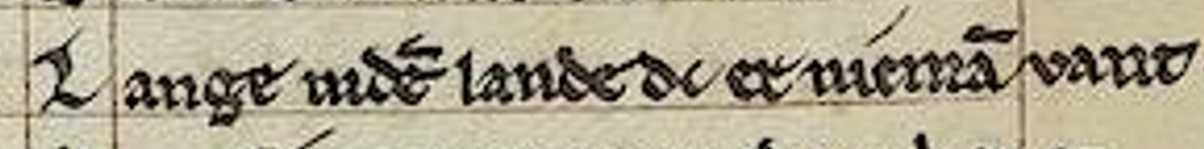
Lange inde(m) lande d(az) er niema(n) vant.
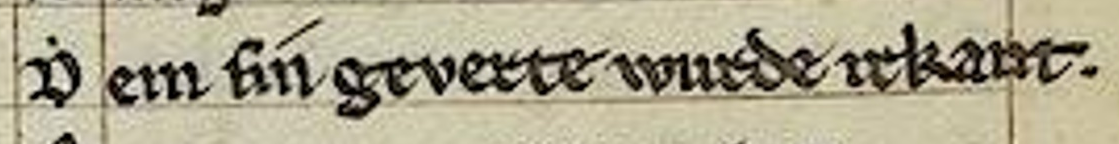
Dem ſin geverte wurde irkant.
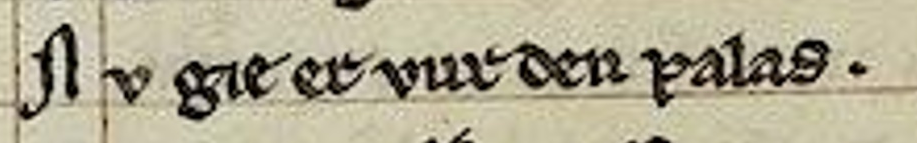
Nv gie er vur den palas.
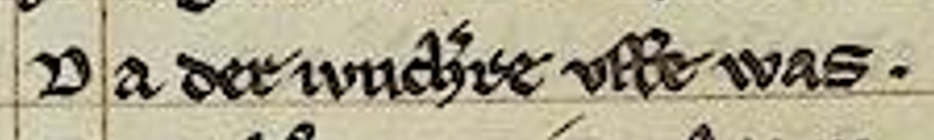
Da der ivnch(er)re vffe was.
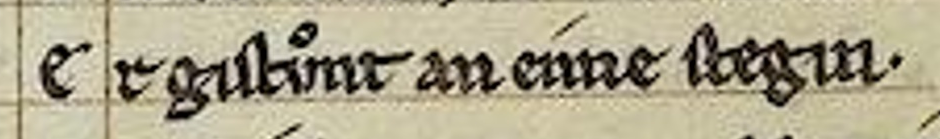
Er giſtv°ont an eime ſtegin.
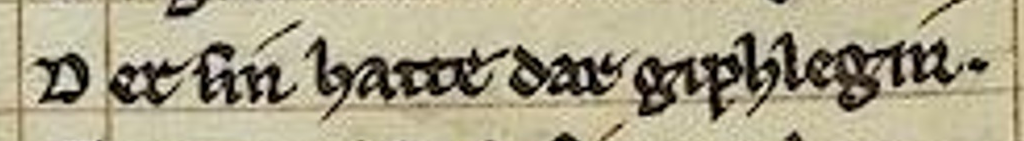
Der ſin hatte dar giphlegin.
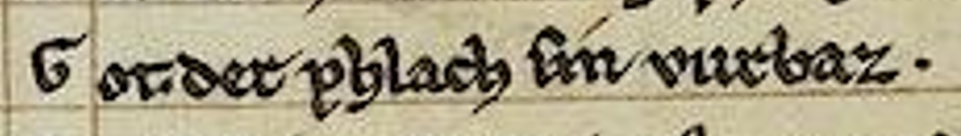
Got. der phlach ſin vurbaz.
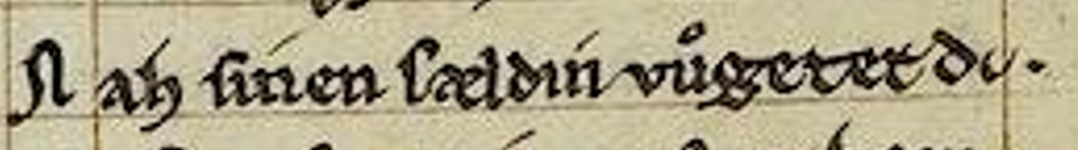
Nah ſinen ſ[ae]ldin vu°ogeter d(az).
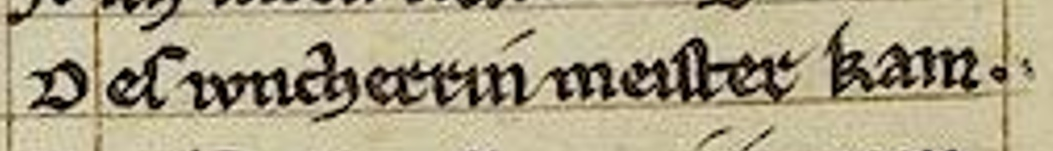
Deſ ivncherrin meiſter kam.
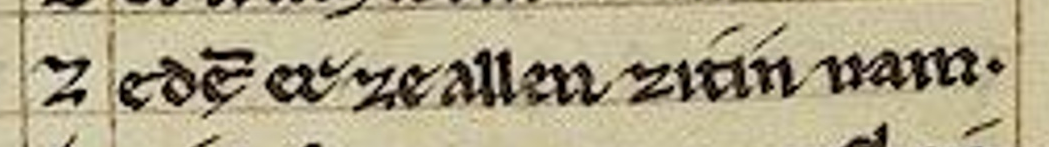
Zede(m) er ze allen zitin nam.
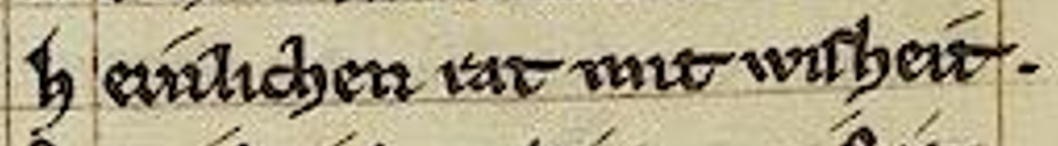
Heinlichen rat mit wiſheit.
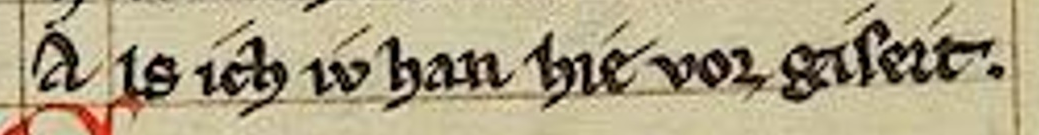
Als ich iv han hie vor giſeit.
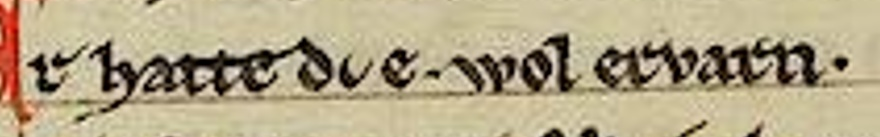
*Er hatte daz e. wol ervarn.
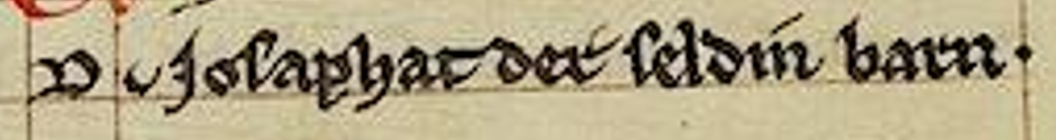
D(az) Joſaphat der ſeldin barn.
